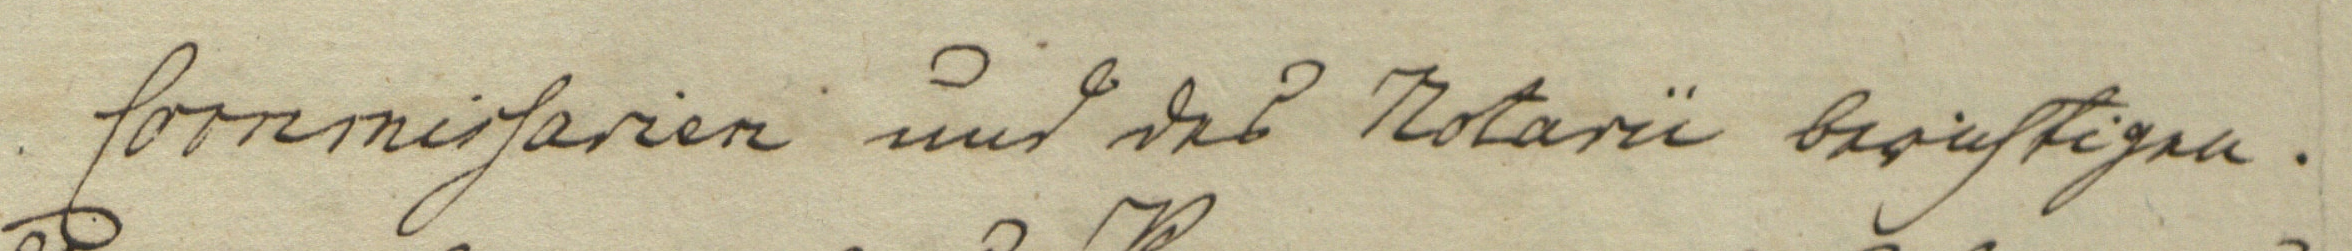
Commissarien und des Notarii berichtigen.
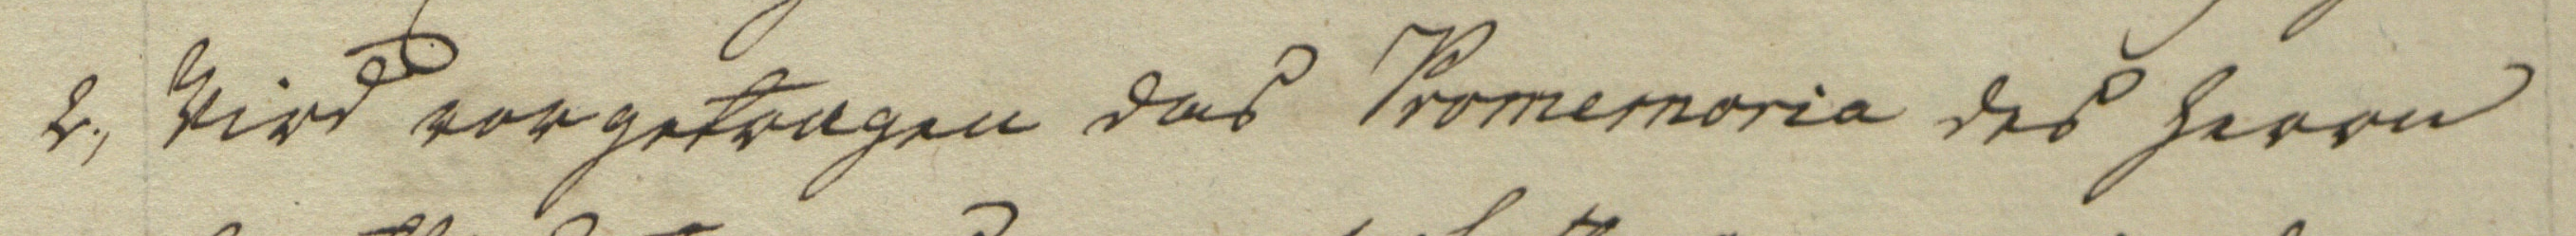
2., Wird vorgetragen das Promemoria des Herrn
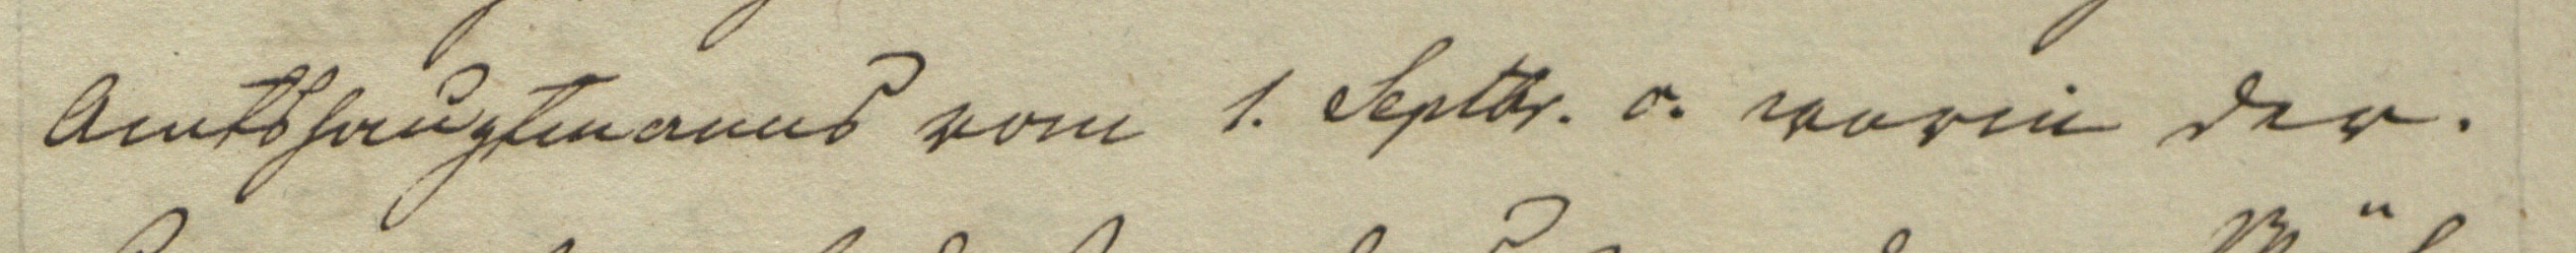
Amtshauptmanns vom 1. Septbr. c. worin der¬
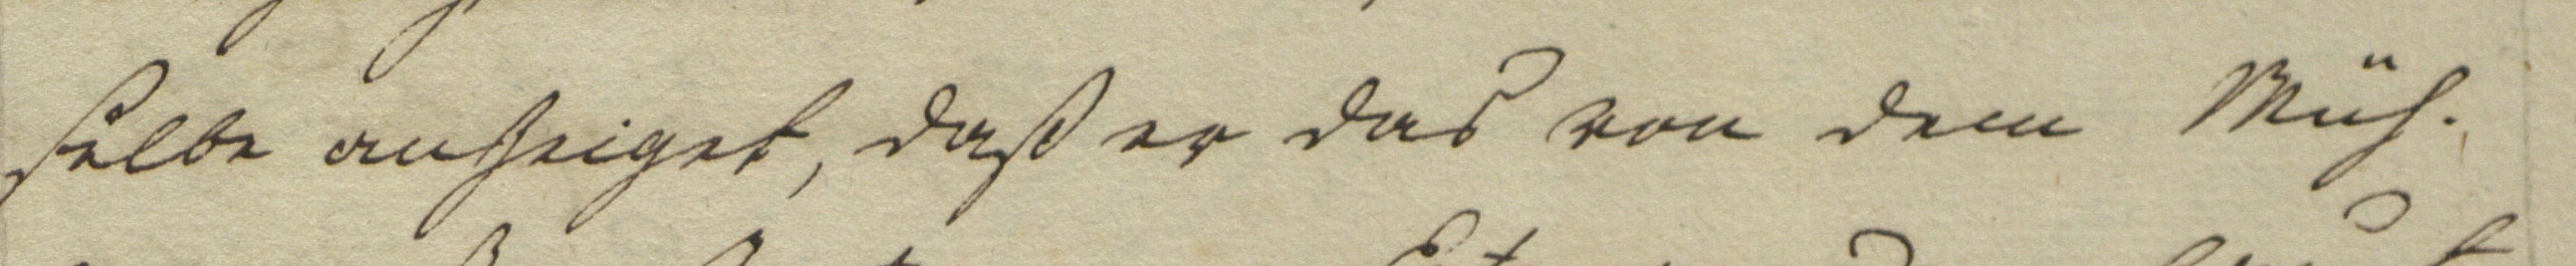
selbe anzeiget, daß er das von dem Müh¬
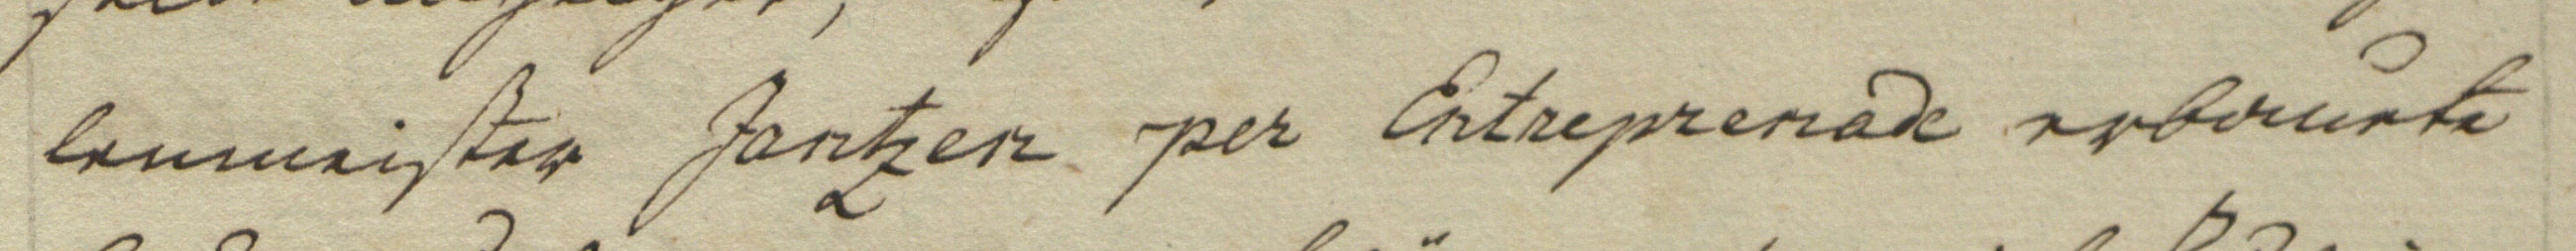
lenmeister Jantzen per Entreprenade erbauete
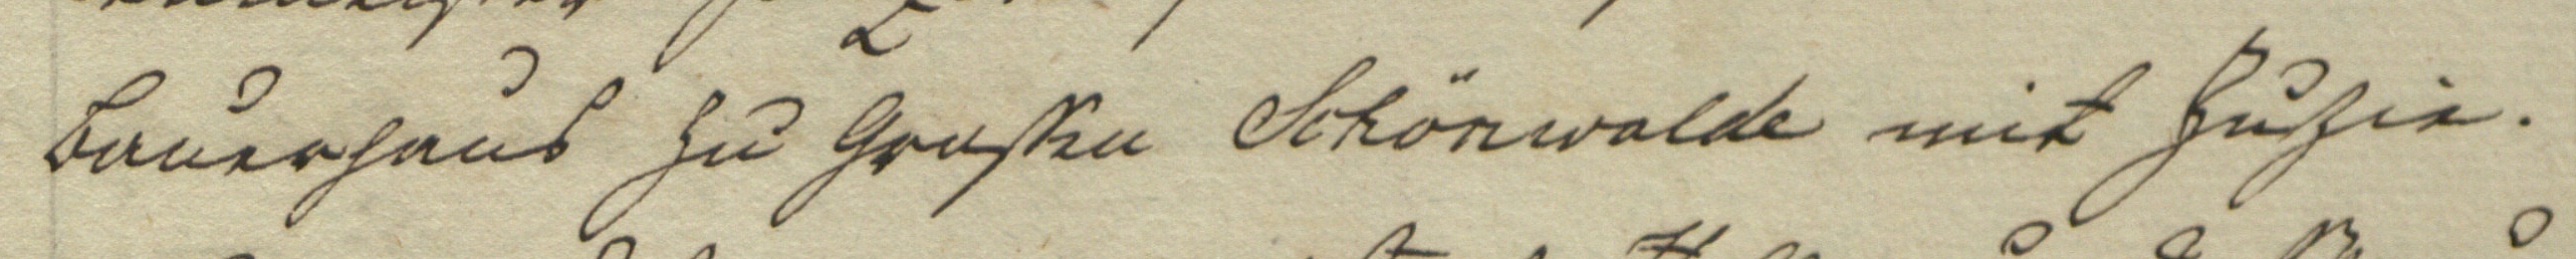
Bauerhaus zu Grossen Schönwalde mit Zuzie¬
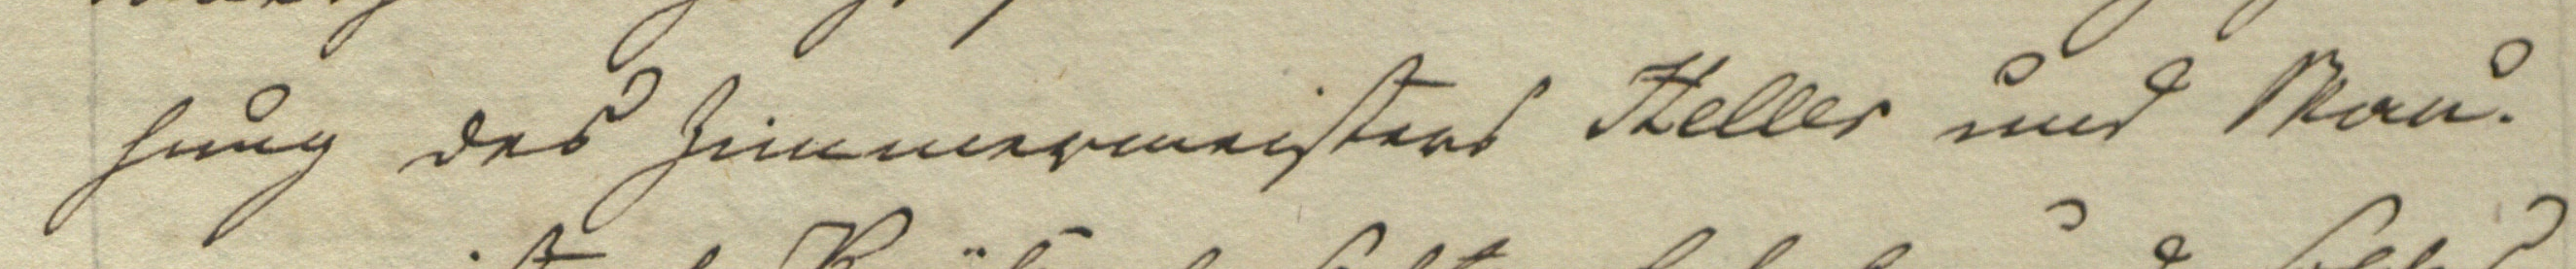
hung des Zimmermeisters Heller und Mau¬
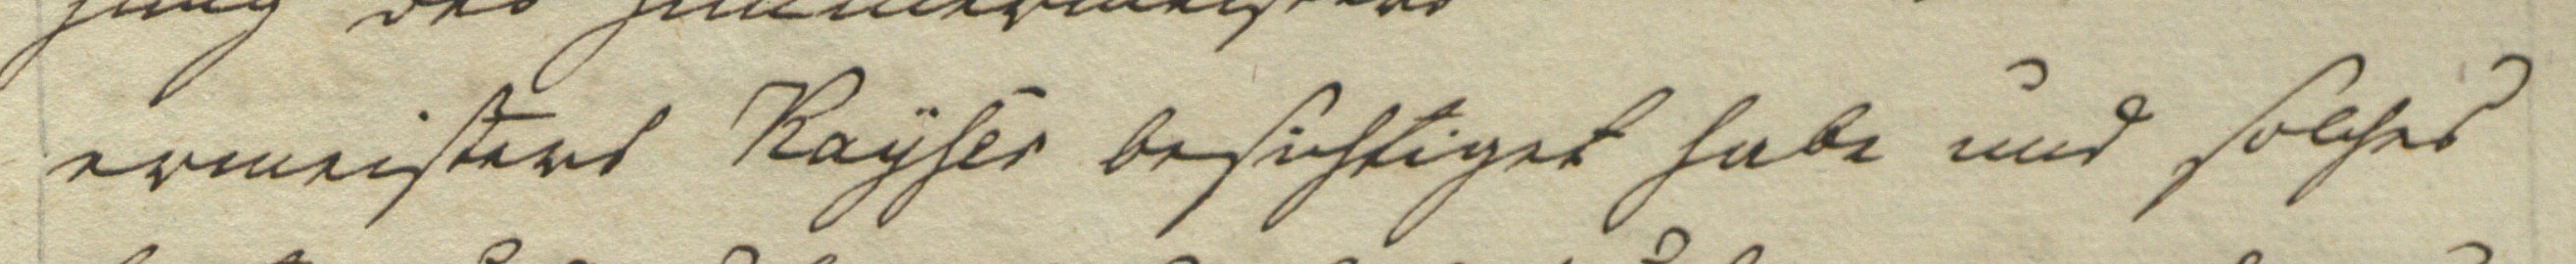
ermeisters Kaÿser besichtiget habe und solches
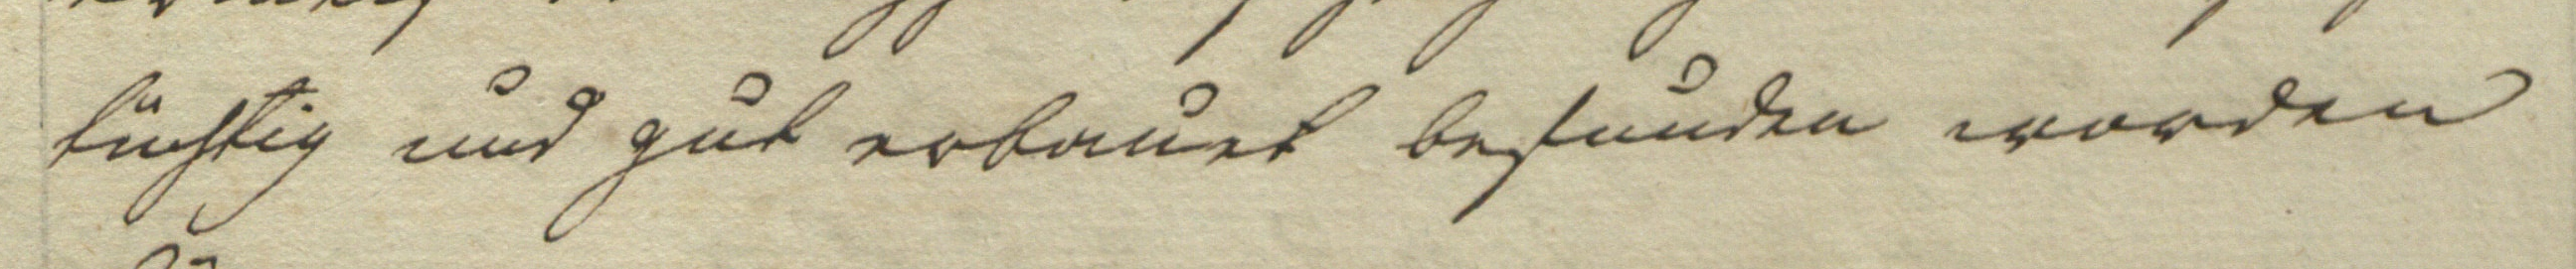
tüchtig und gut erbauet befunden worden
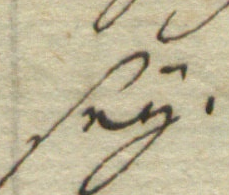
seÿ.
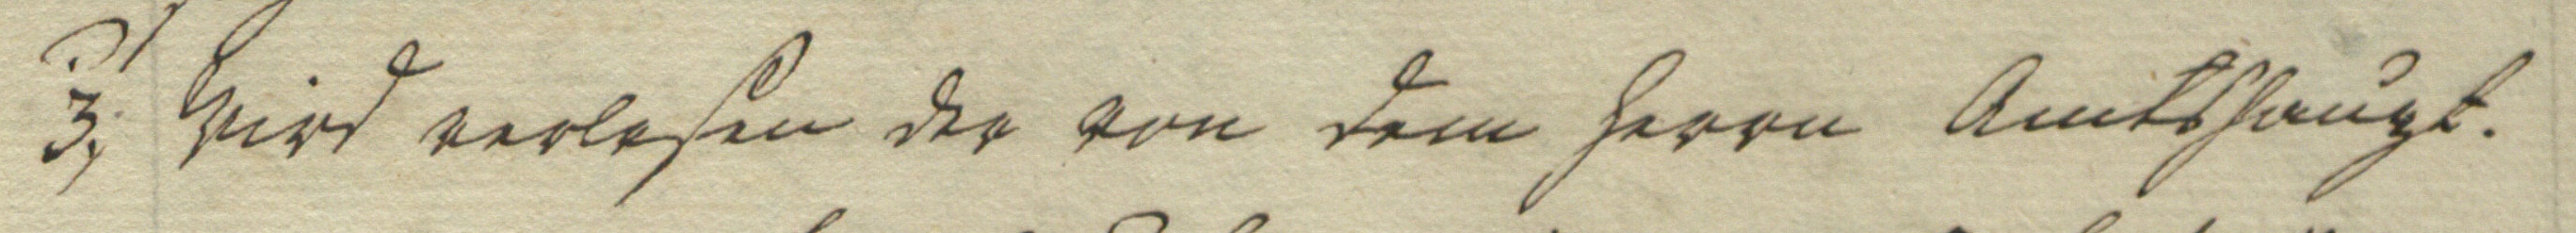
3. Wird verlesen der von dem Herrn Amtshaupt¬
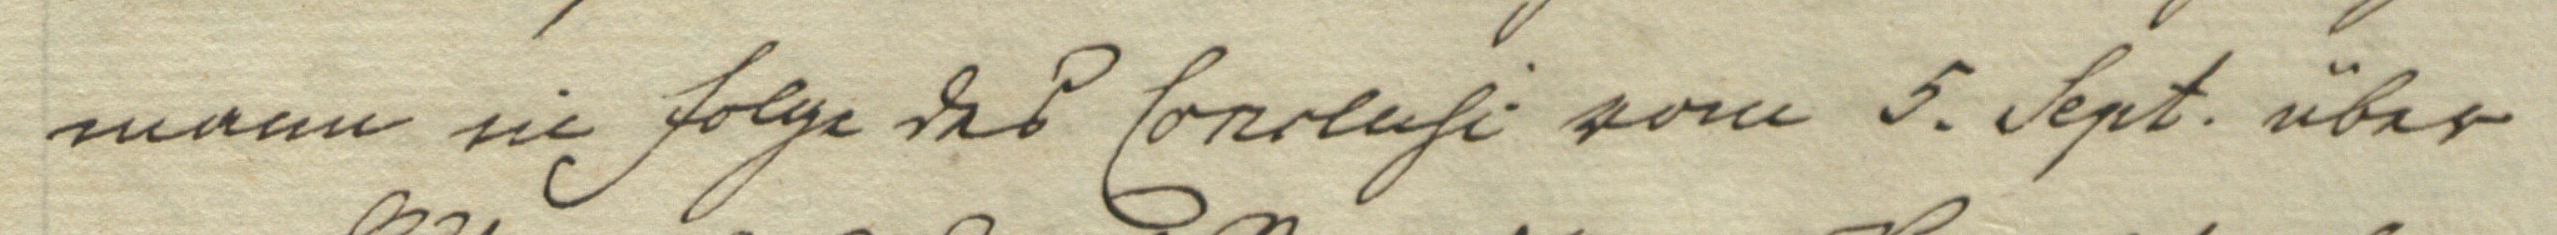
mann in Folge des Conclusi vom 5. Sept. über
